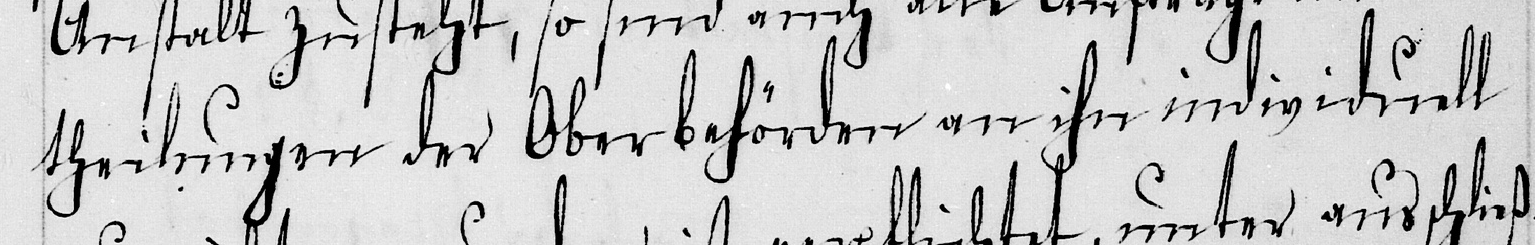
theilungen der Oberbehörden an ihn individuell
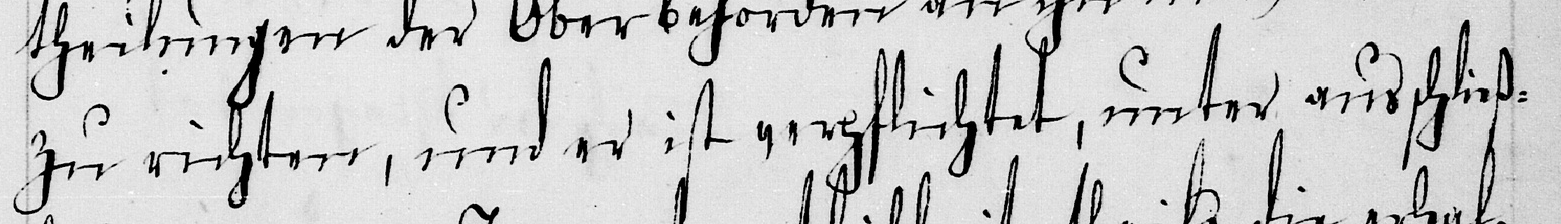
zu richten, und er ist verpflichtet, unter ausschließ¬
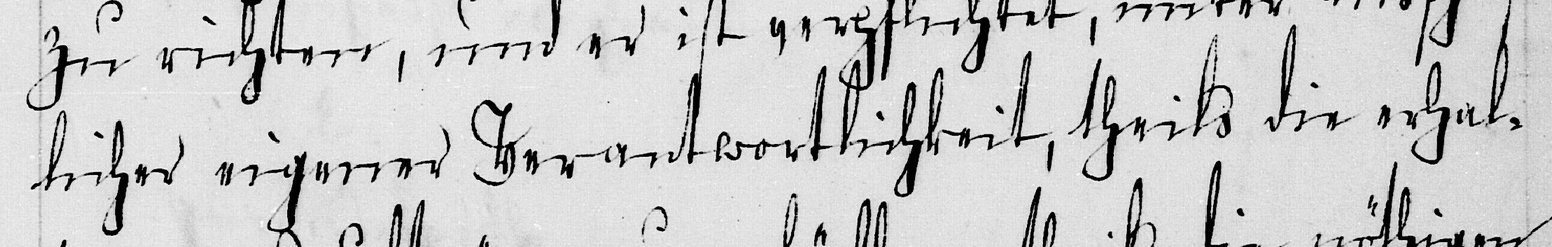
licher eigener Verantwortlichkeit, theils die erhal¬
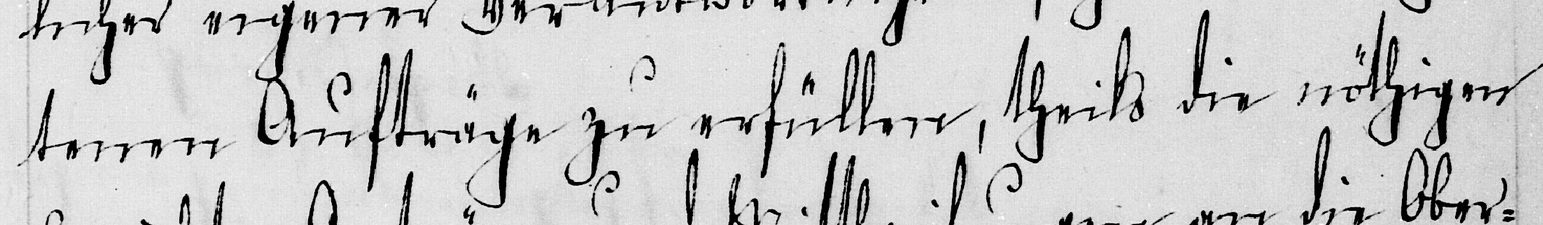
tenen Aufträge zu erfüllen, theils die nöthigen
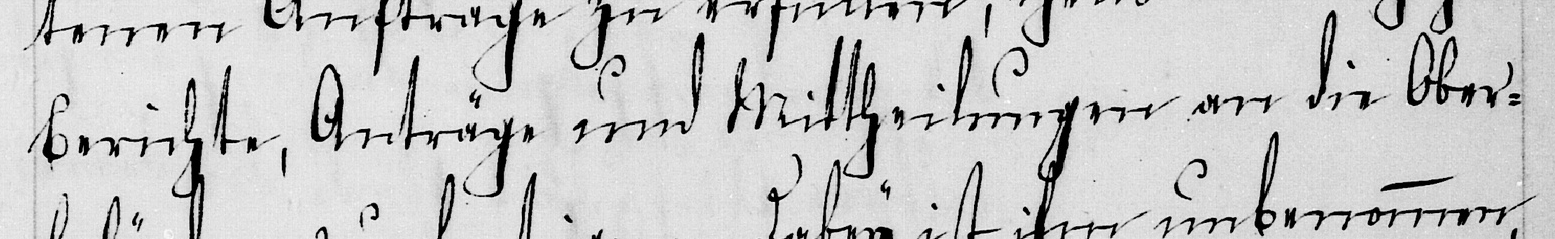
Berichte, Anträge und Mittheilungen an die Ober¬
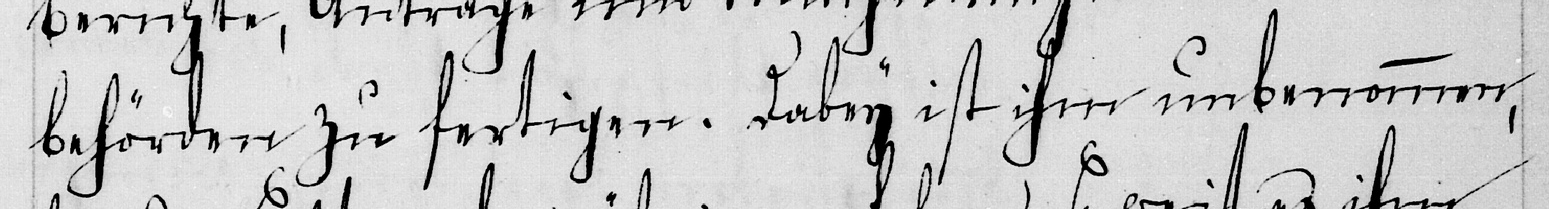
behörden zu fertigen. Dabey ist ihm unbenommen,
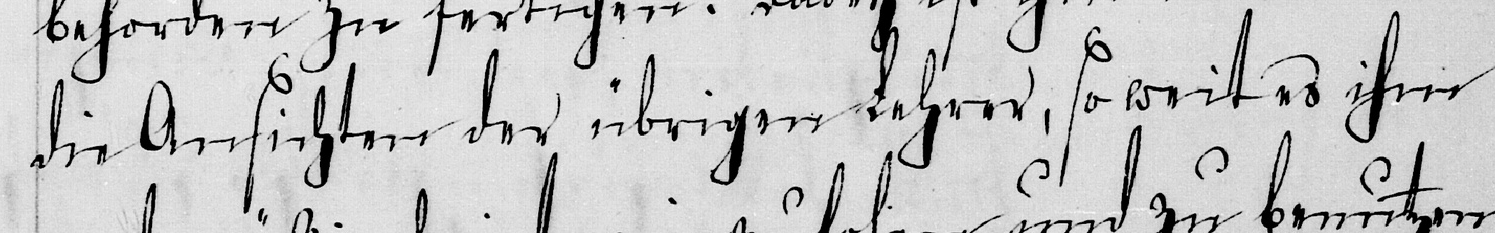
die Ansichten der übrigen Lehrer, so weit es ihm
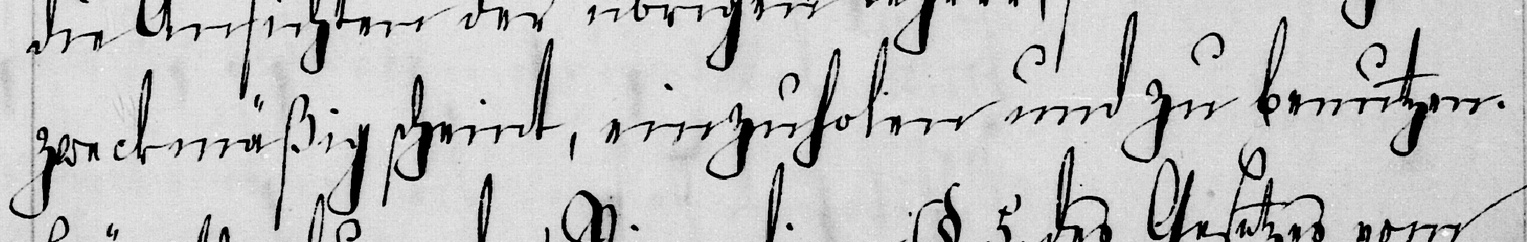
zweckmäßig scheint, einzuholen und zu benutzen.
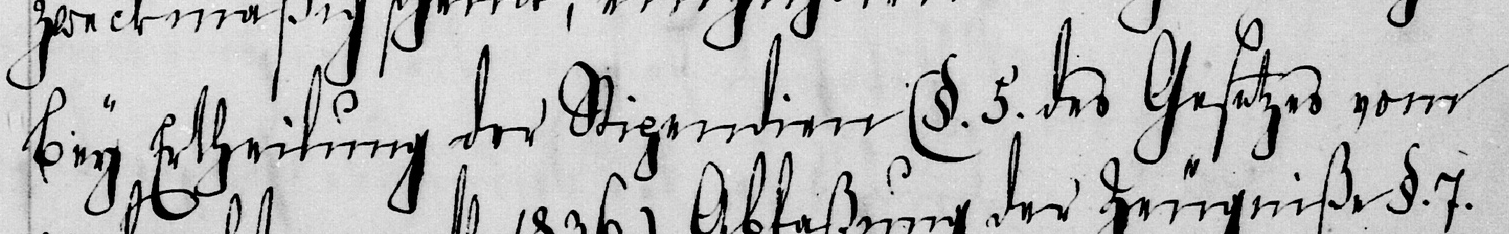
Bey Ertheilung der Stipendien (§. 5. des Gesetzes vom
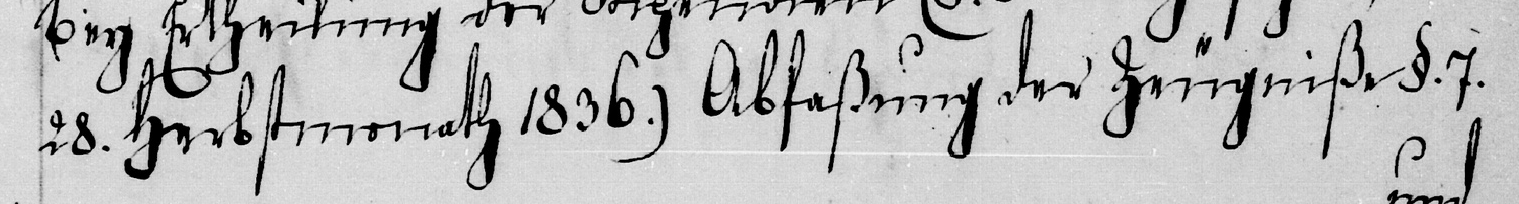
28. Herbstmonath 1836.) Abfaßung der Zeugniße §. 7.
